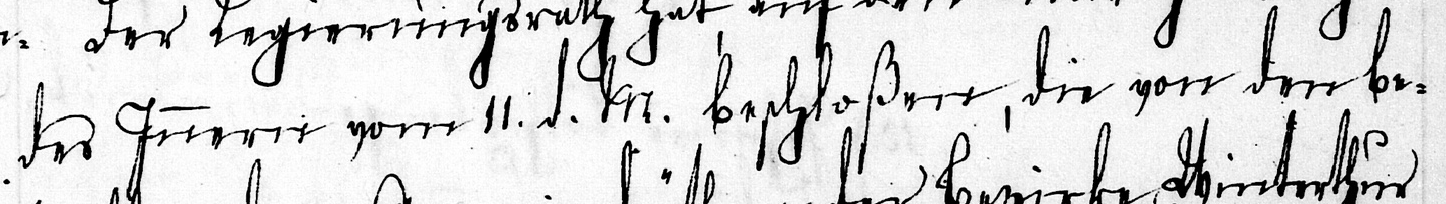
des Innern vom 11. d. M. beschloßen, die von den be¬
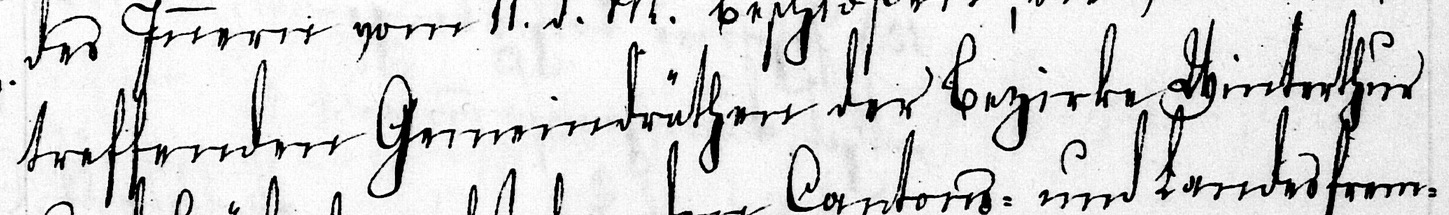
treffenden Gemeindräthen der Bezirke Winterthur
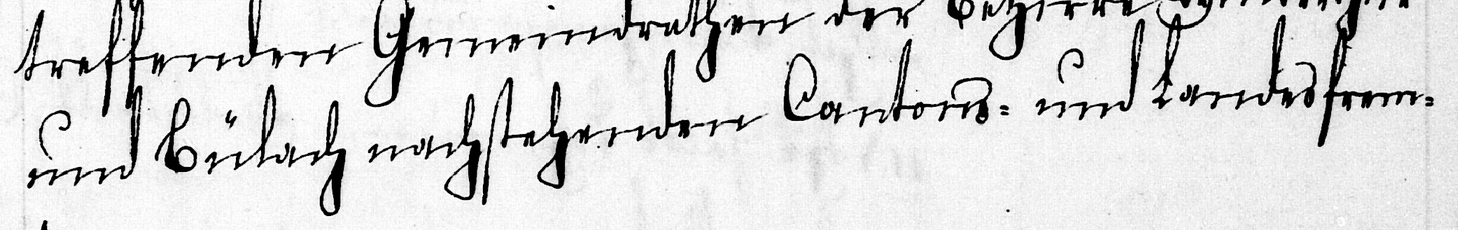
und Bülach nachstehenden Cantons- und Landesfrem¬
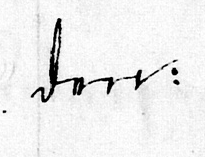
den:
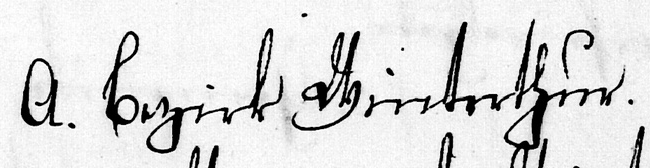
A. Bezirk Winterthur.
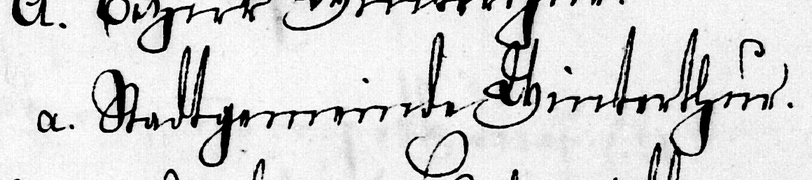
a. Stadtgemeinde Winterthur.
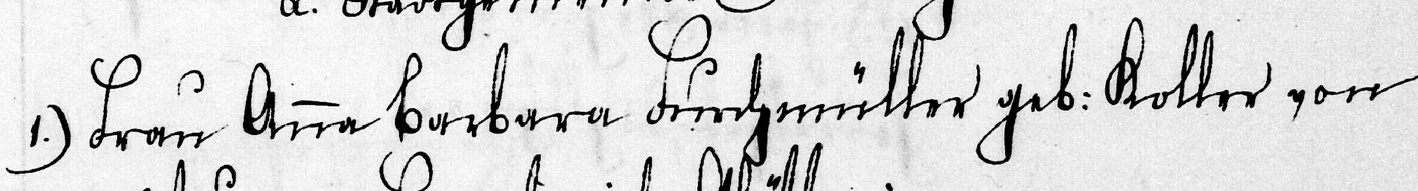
1.) Frau Anna Barbara Furchmüller geb: Koller von
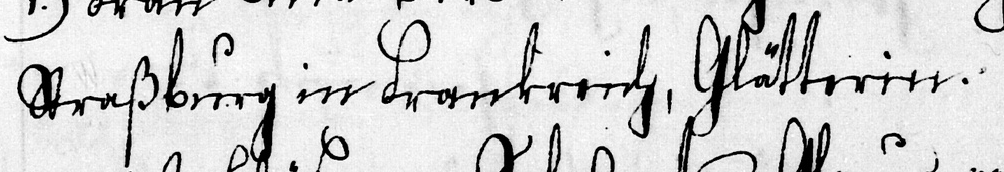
Straßburg in Frankreich, Glätterin.
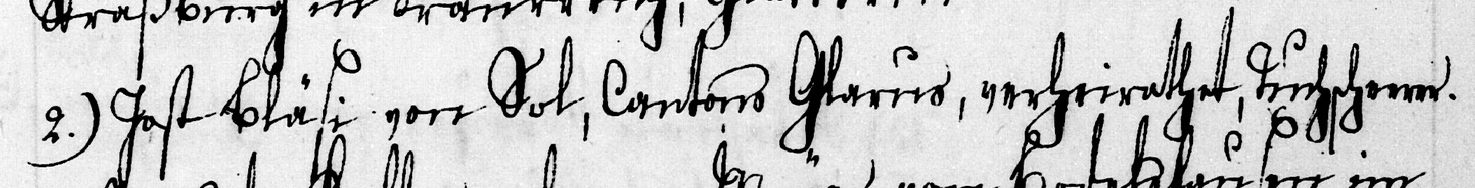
2.) Jost Bläsi von Sol, Cantons Glarus, verheirathet, Tuchsche¬
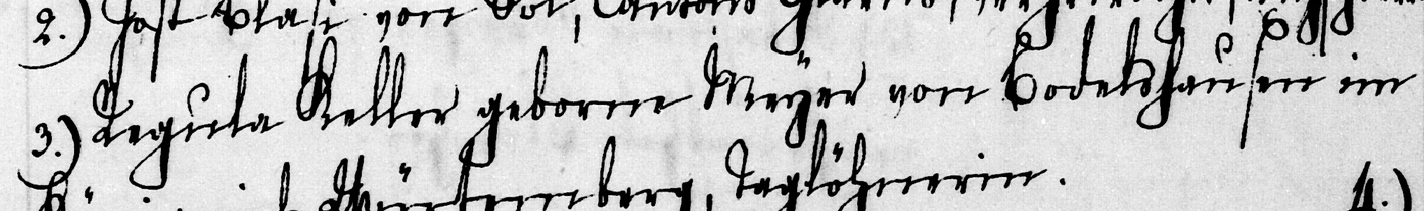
3.) Regula Keller geborne Meyer von Bodelshausen im
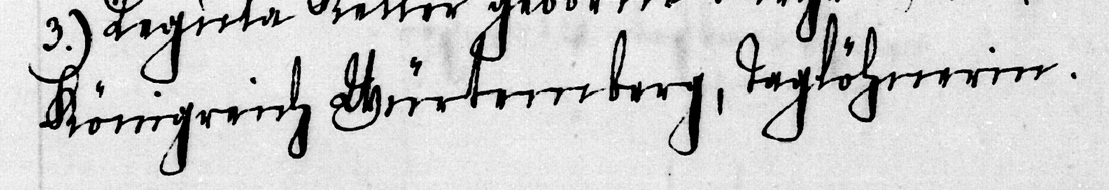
Königreich Würtemberg, Taglöhnerin.
